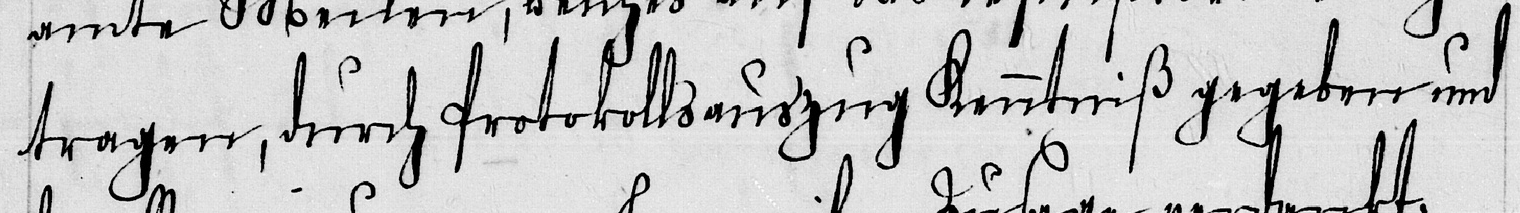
tragen, durch Protokollsauszug Kenntniß gegeben und
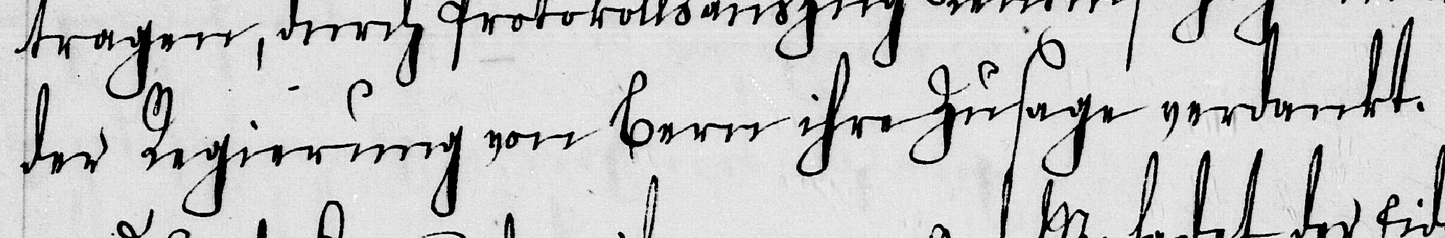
der Regierung von Bern ihre Zusage verdankt.
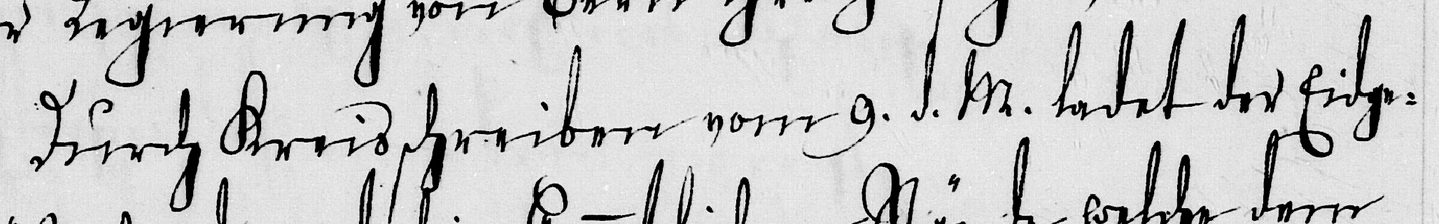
Durch Kreisschreiben vom 9. d. M. ladet der Eidge¬
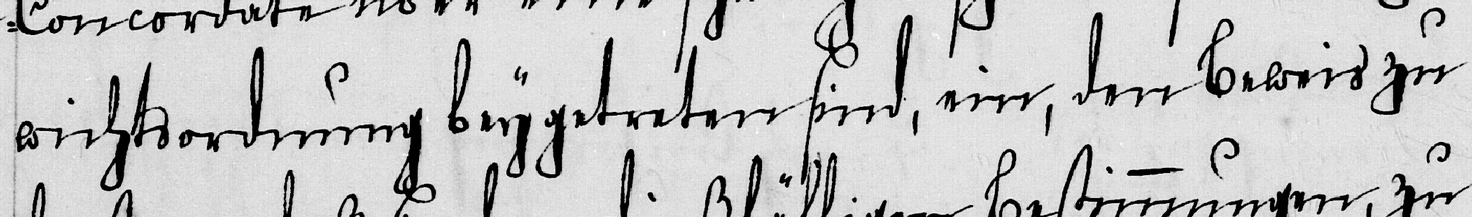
wichtsordnung beygetreten sind, ein, den Beweis zu
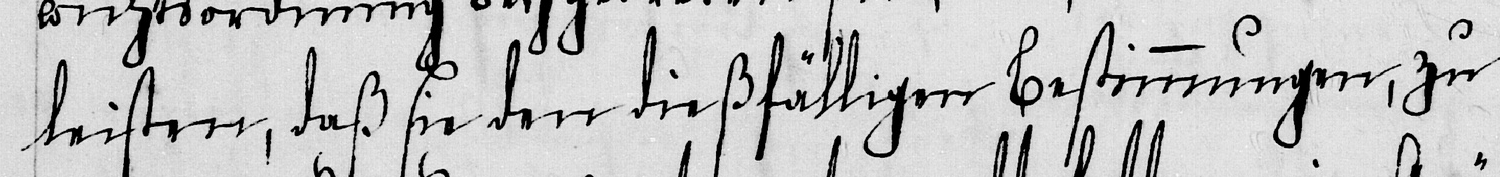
leisten, daß sie den dießfälligen Bestimmungen, zu
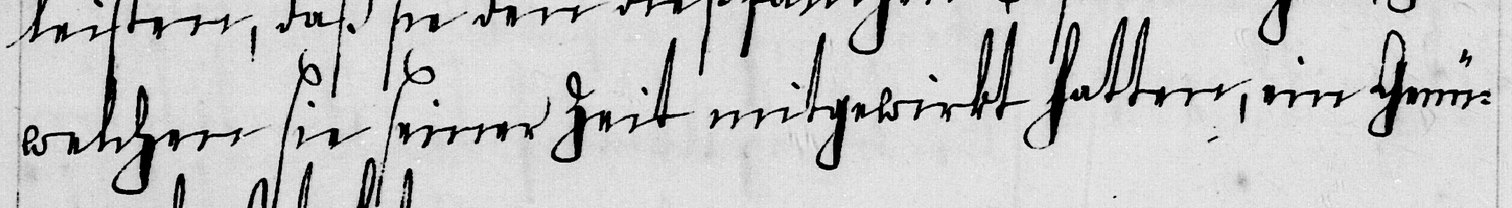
welchen sie seiner Zeit mitgewirkt hatten, ein Genü¬
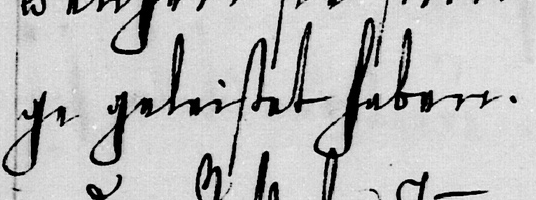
ge geleistet haben.
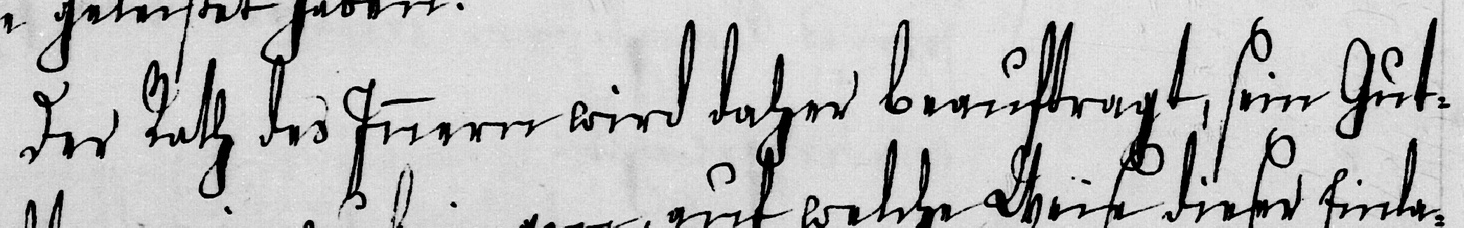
Der Rath des Innern wird daher beauftragt, sein Gut¬
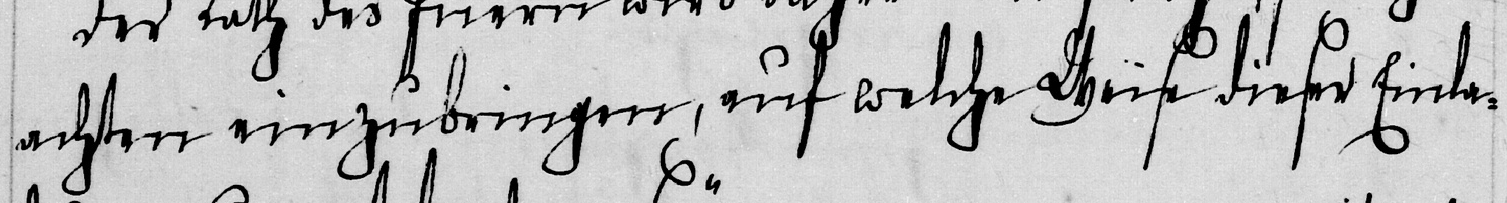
achten einzubringen, auf welche Weise dieser Einla¬
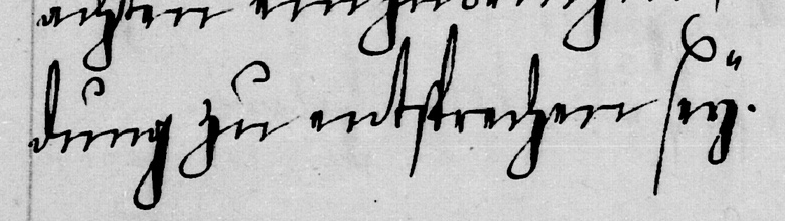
dung zu entsprechen sey.
